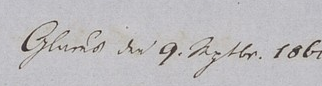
Glarus den 9. Septbr. 1861.
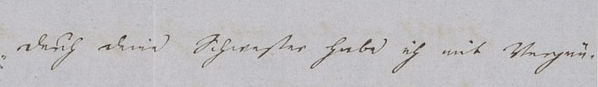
Durch Deine Schwester habe ich mit Vergnü-
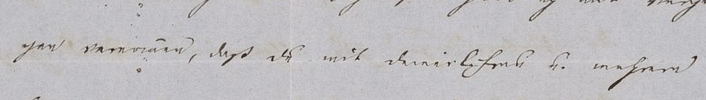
gen vernommen, daß Du mit Deiner l. Frau u. mehrern
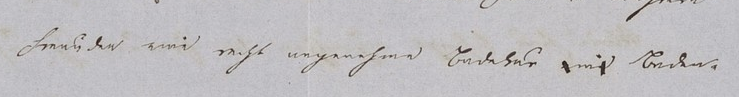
Freunden eine recht angenehme Badekur in Baden-
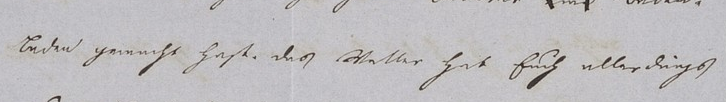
Baden gemacht hast. Das Wetter hat Euch allerdings
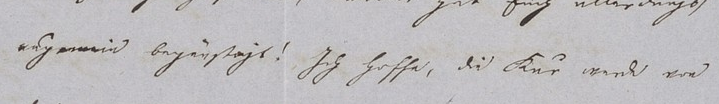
ungemein begünstigt! Ich hoffe, die Kur werde von
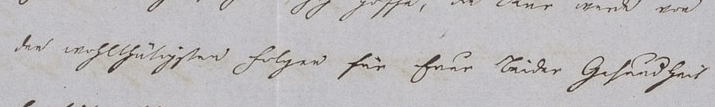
den wohlthätigsten Folgen für Euer Beider Gesundheit
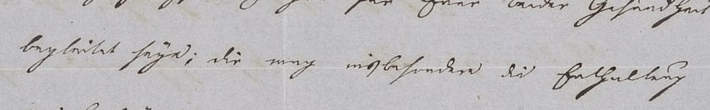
begleitet seyn; Dir mag insbesondere die Enthaltung
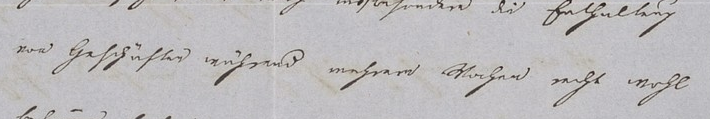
von Geschäften während mehrern Wochen recht wohl
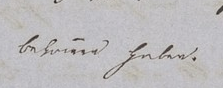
bekommen haben.
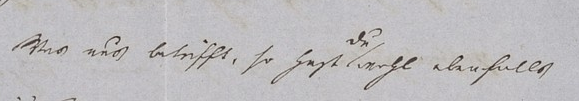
Was uns betrifft, so hast Du wohl ebenfalls
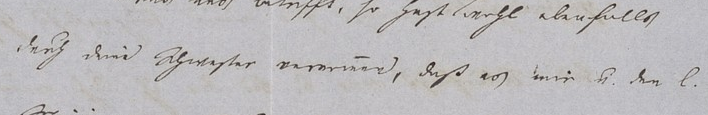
durch Deine Schwester vernommen, daß es mir u. den l.
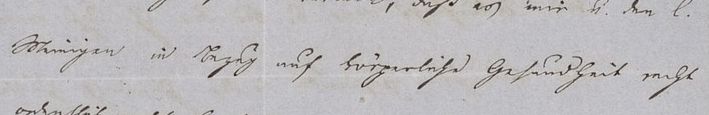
Meinigen in Bezug auf körperliche Gesundheit recht
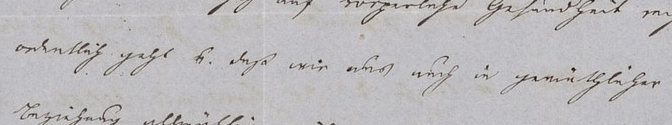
ordentlich geht u. daß wir uns auch in gemüthlicher
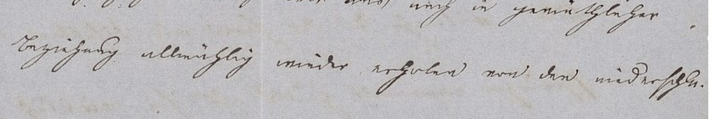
Beziehung allmählig wieder erholen von den niederschla-
